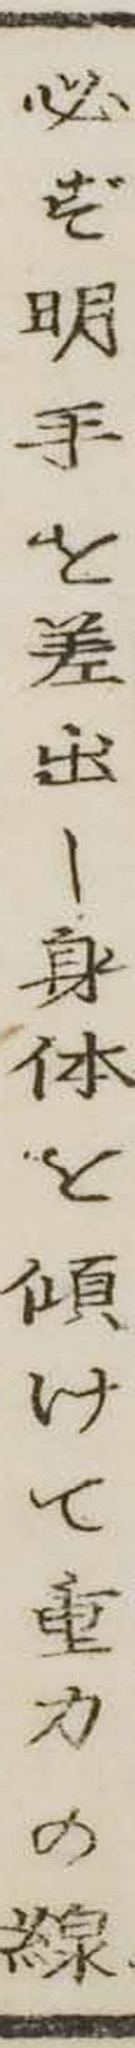必ず明手を差出し身体を傾けて重力の線
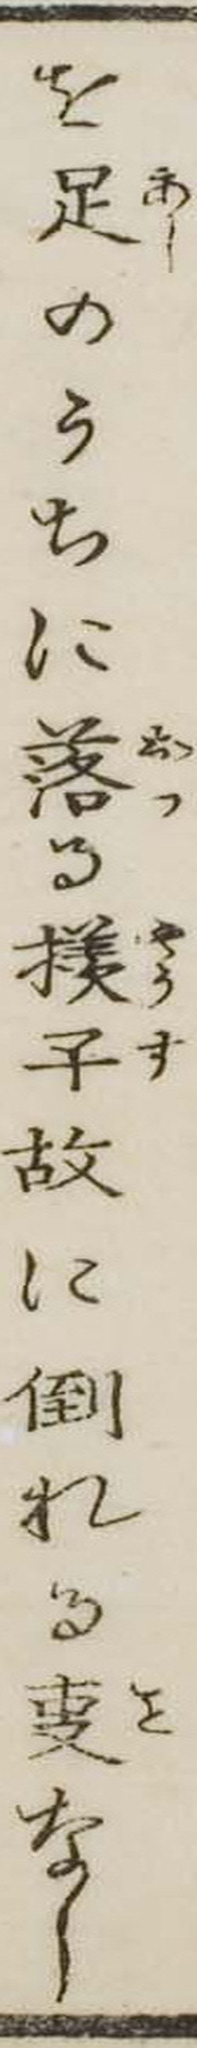を足のうちに落る様子故に倒れる叓なし
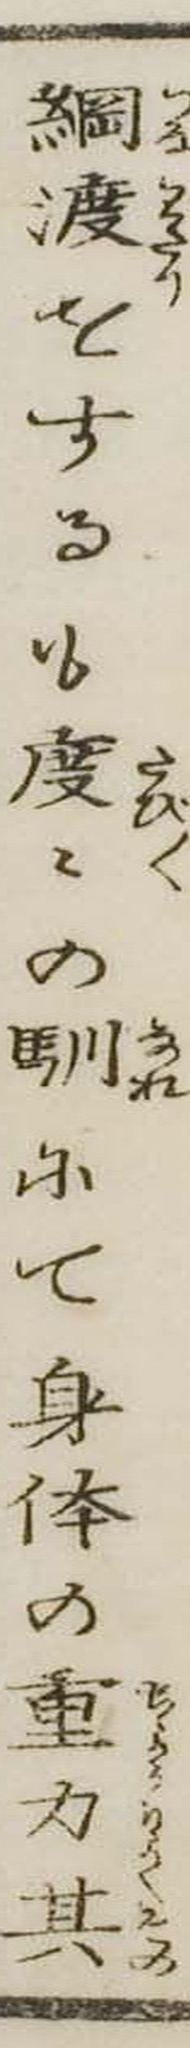綱渡をするも度〻の馴にて身体の重力其
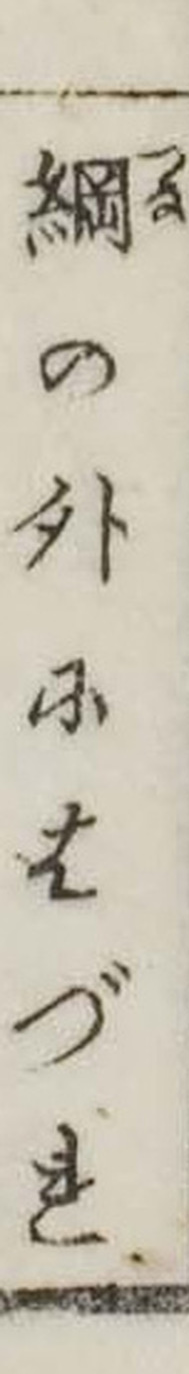綱の外にはづれ
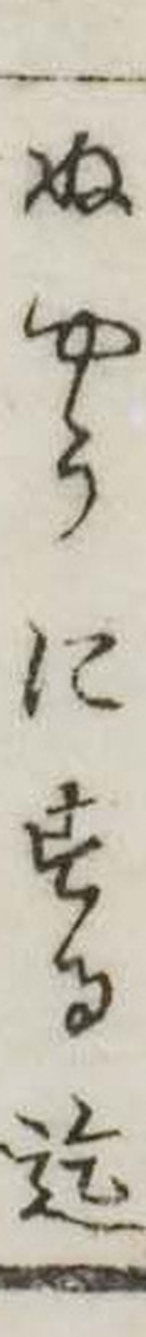ぬやうにする迄
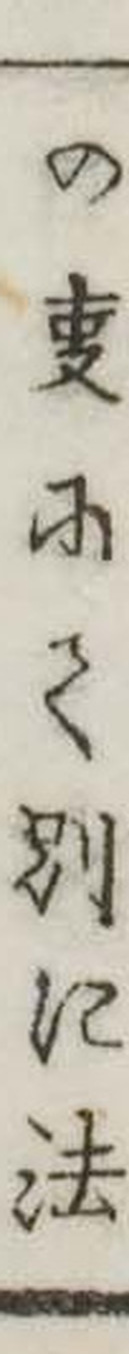の叓にて別に法
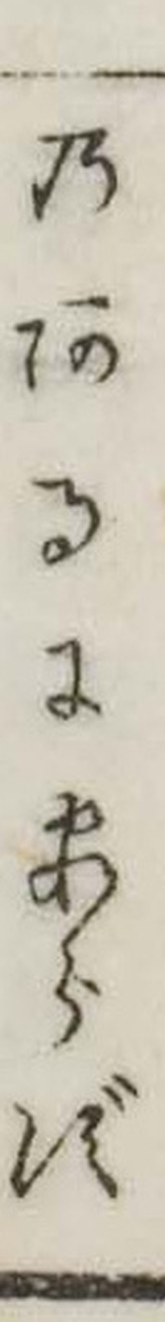のあるにあらず
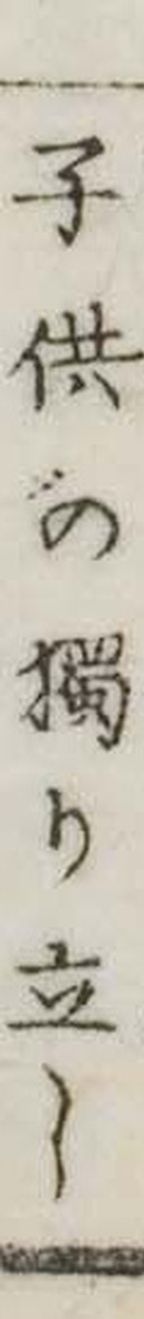子供の獨り立し
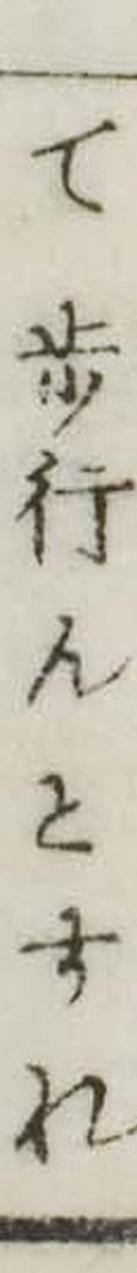て歩行んとすれ
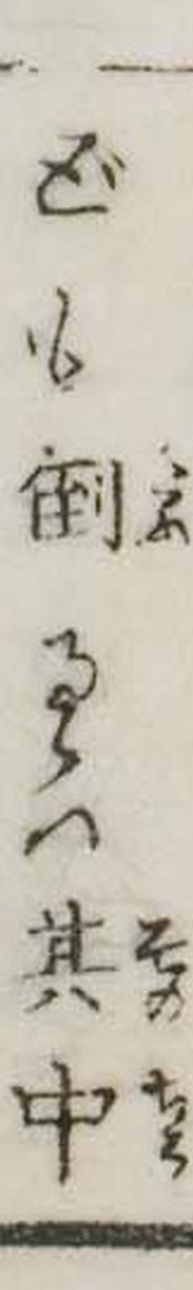ども倒るゝは其中
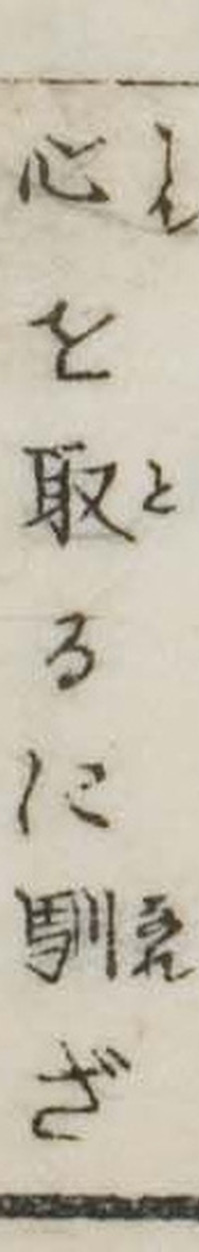心を取るに馴ざ

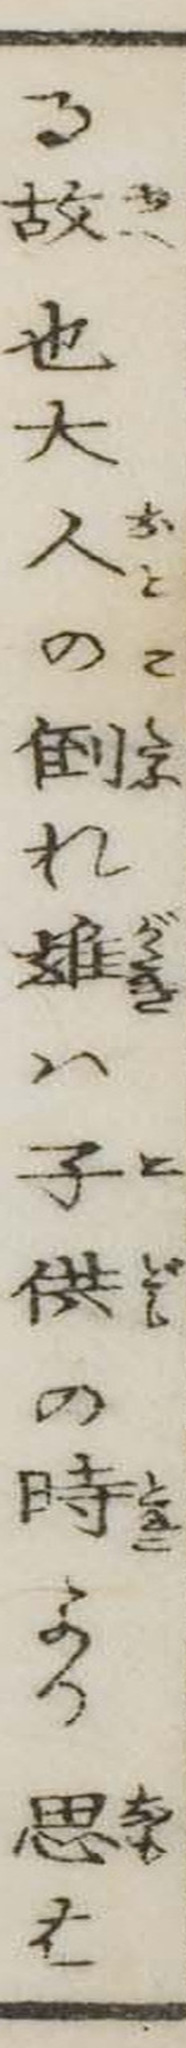る故也大人の倒れ难は子供の時より思は
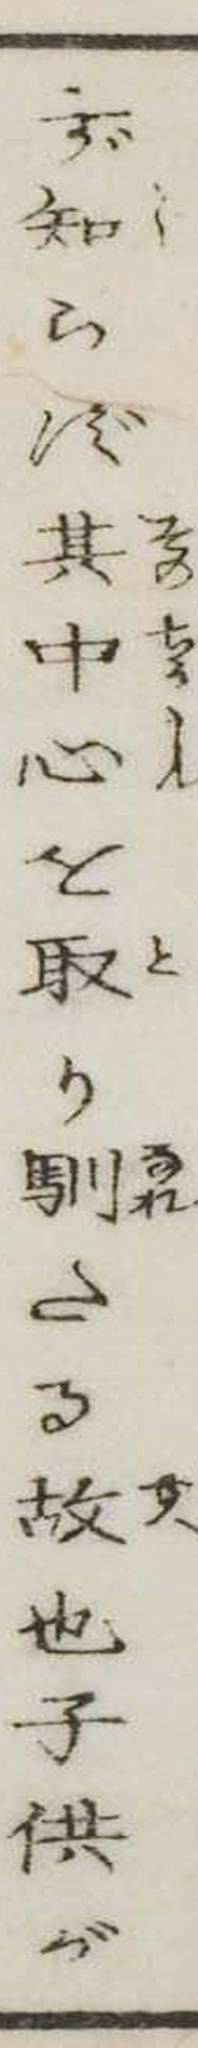ず知らず其中心を取り馴たる故也子供が
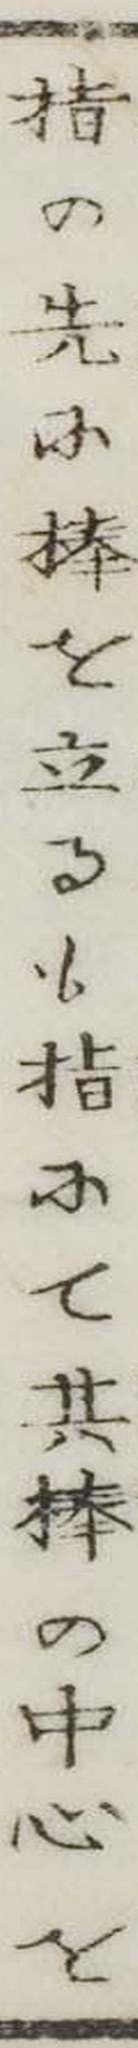指の先に棒を立るも指にて其棒の中心を
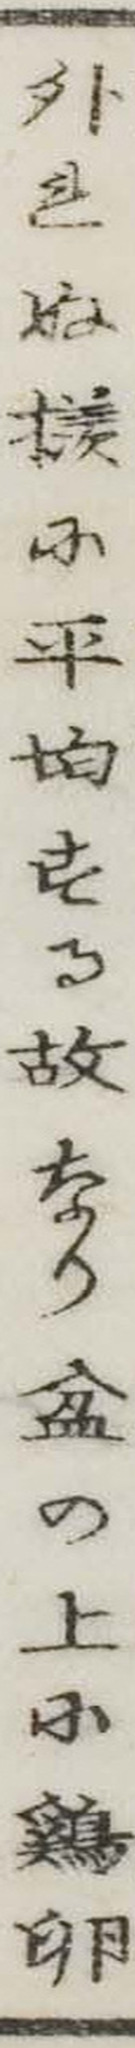外れぬ様に平均する故なり盆の上に鶏卵
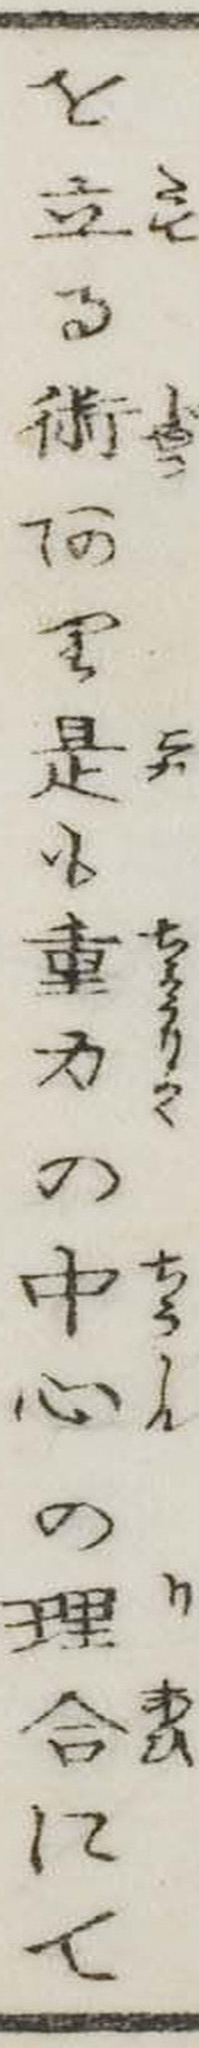を立る術あり是も重力の中心の理合にて
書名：究理知慧の勧 : 訓蒙画入 巻之2
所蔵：東京学芸大学附属図書館
